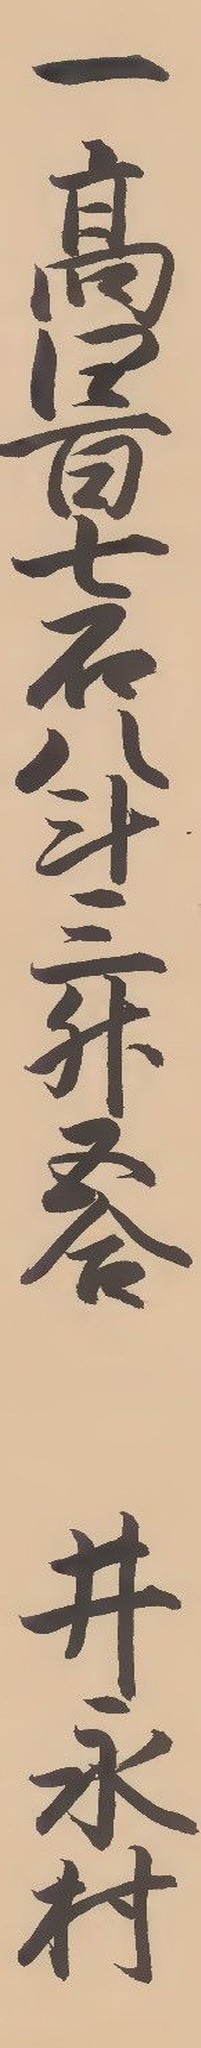一高四百七石八斗三升五合井永村
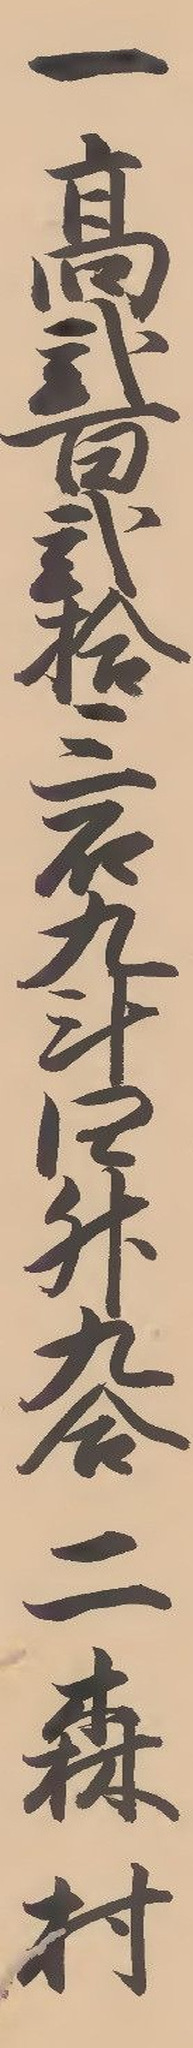一高弐百弐拾三石九斗四升九合二森村

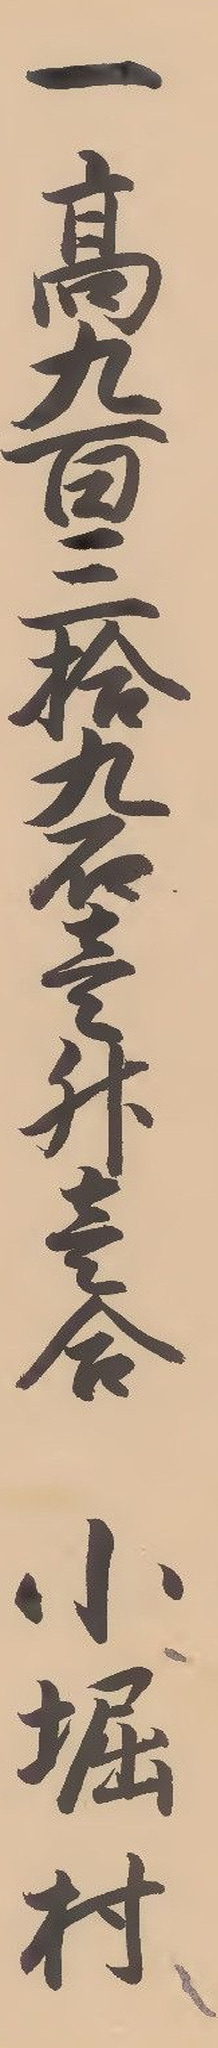一高九百三拾九石壱升壱合小堀村
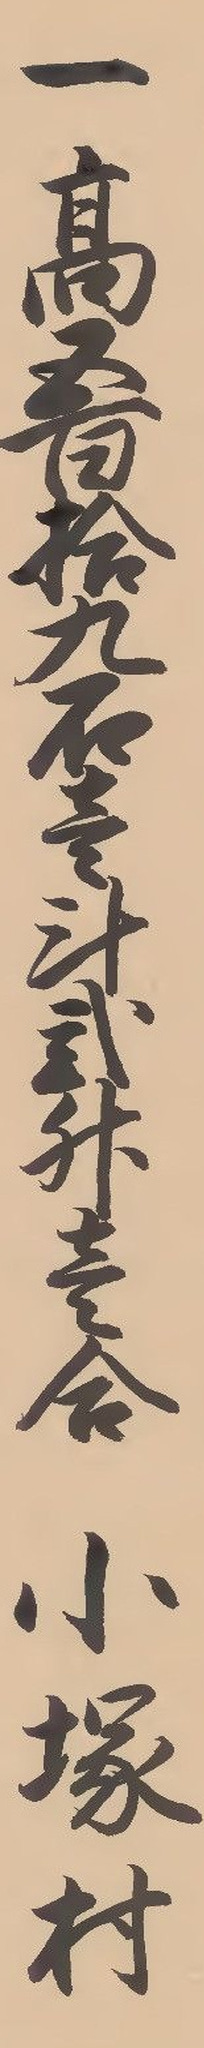一高五百拾九石壱斗弐升壱合小塚村
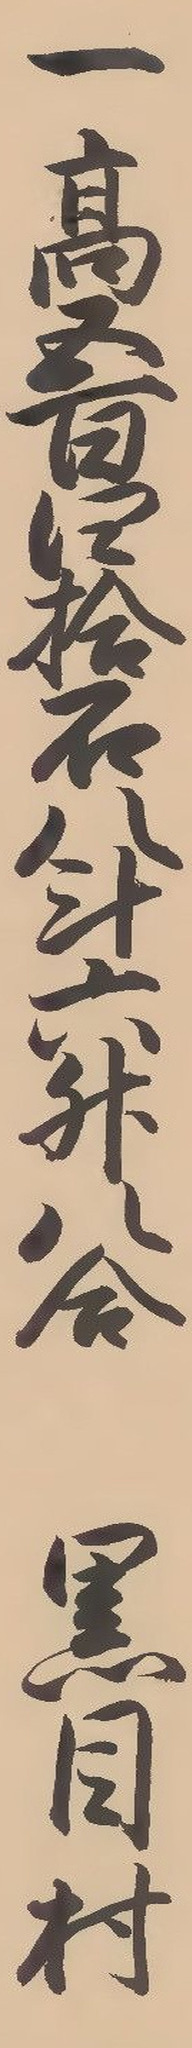一高五百四拾石八斗六升八合黒目村
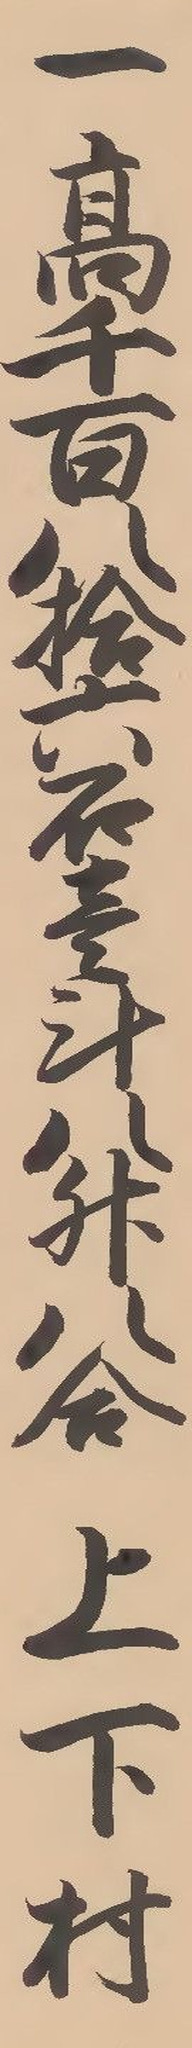一高千百八拾六石壱斗八升八合上下村
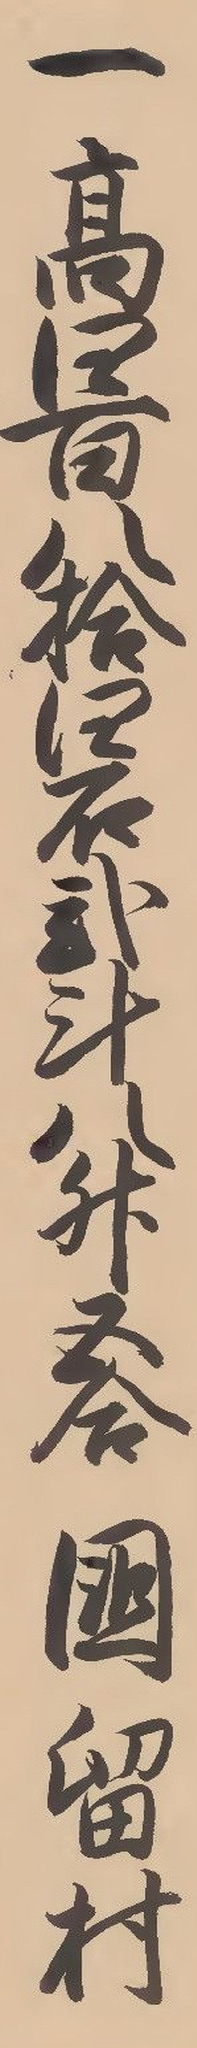一高四百八拾四石弐斗八升五合国留村
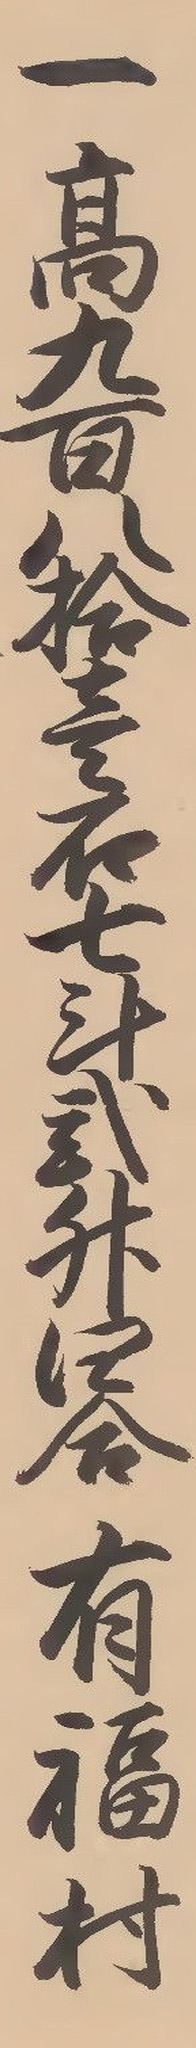一高九百八拾壱石七斗弐升四合有福村
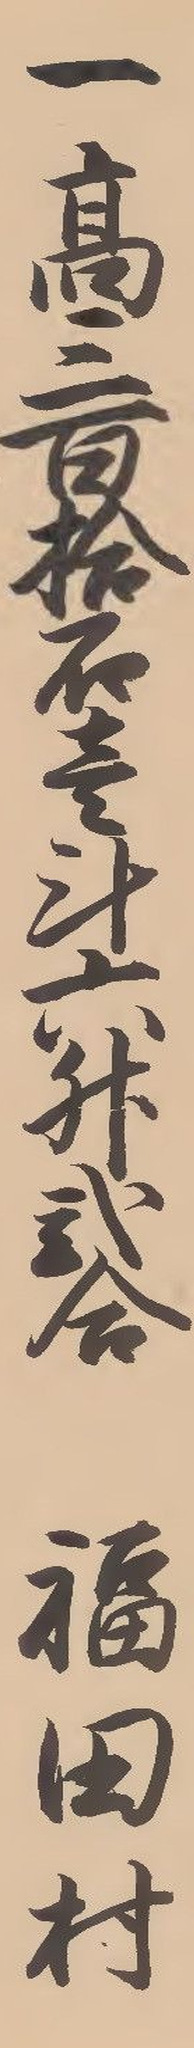一高三百拾石壱斗六升弐合福田村
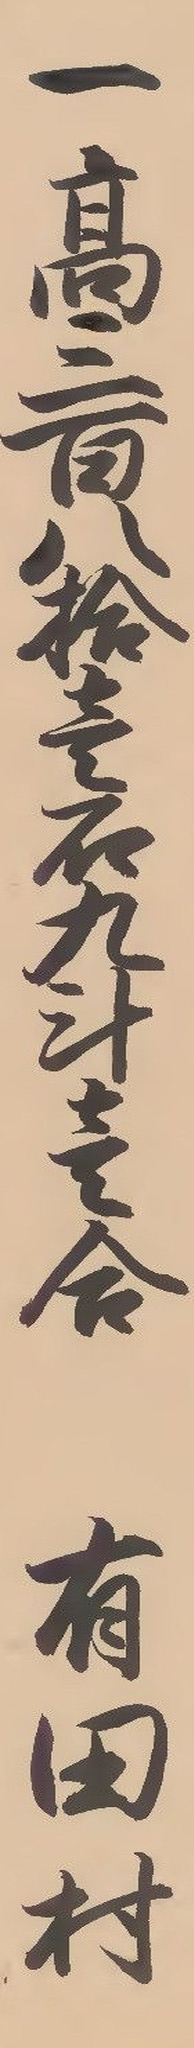一高三百八拾壱石九斗壱合有田村

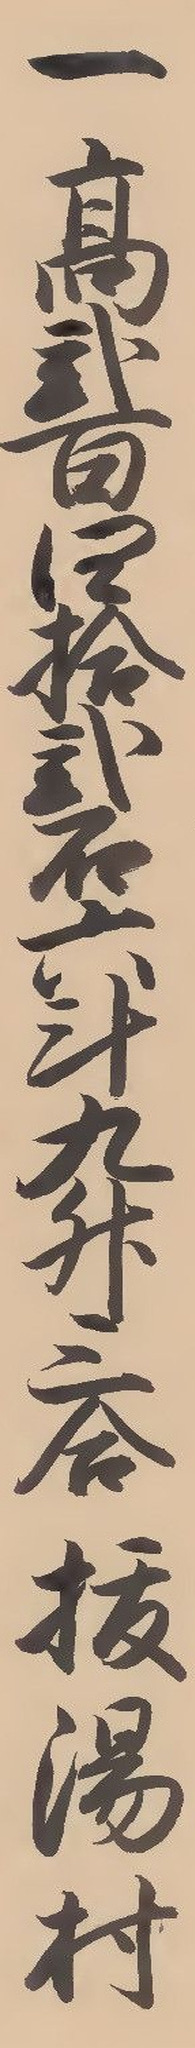一高弐百四拾弐石六斗九升三合抜湯村
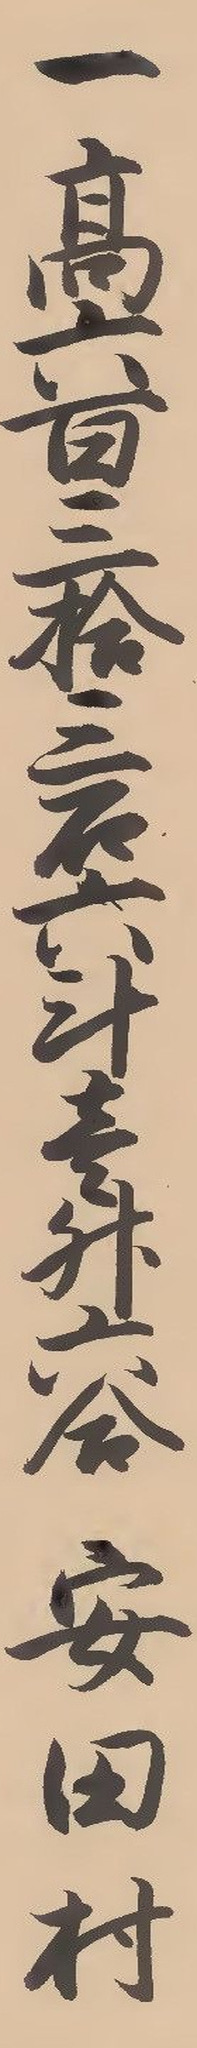一高六百三拾三石六斗壱升六合安田村
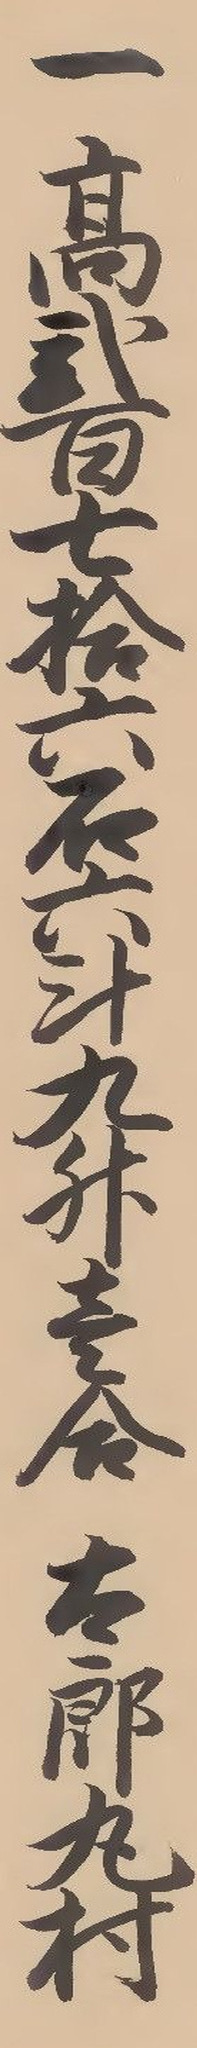一高弐百七拾六石六斗九升壱合太郎丸村
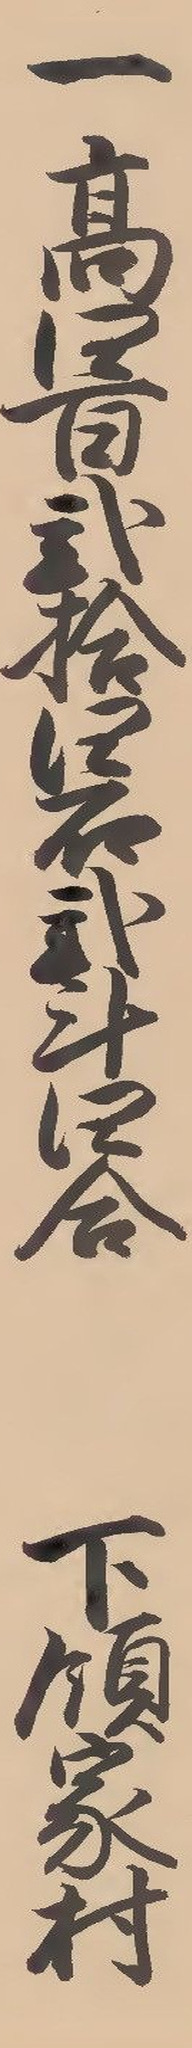一高四百弐拾四石弐斗四合下領家村
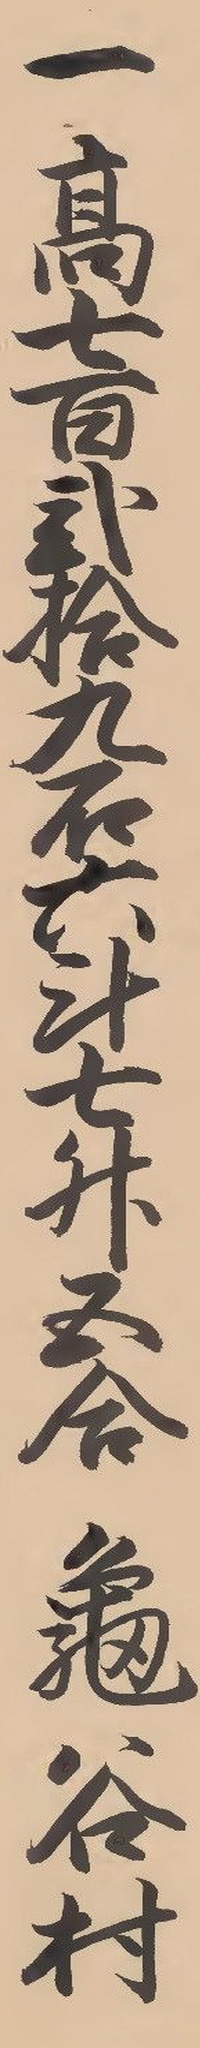一高七百弐拾九石六斗七升五合亀谷村
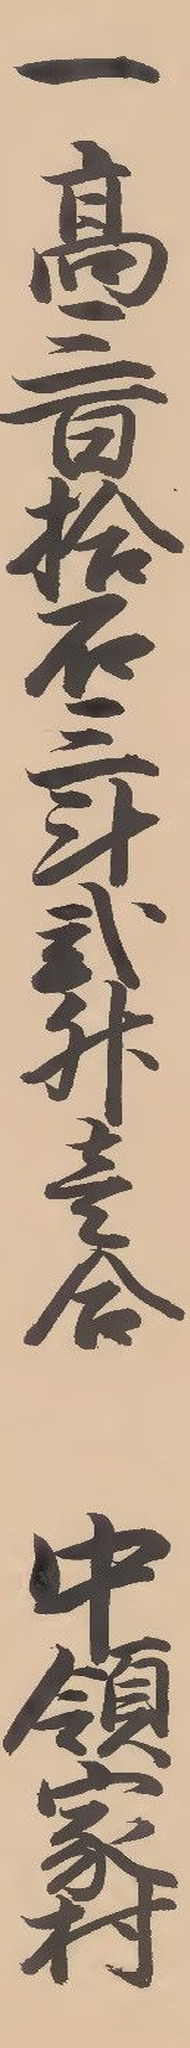一高三百拾石三斗弐升壱合中領家村
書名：備後国郷帳
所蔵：国立公文書館 National Archives of Japan
